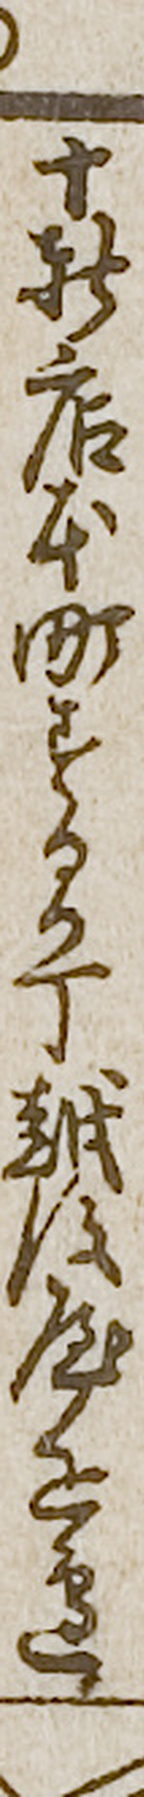十軒店本町するか丁越後屋近辺
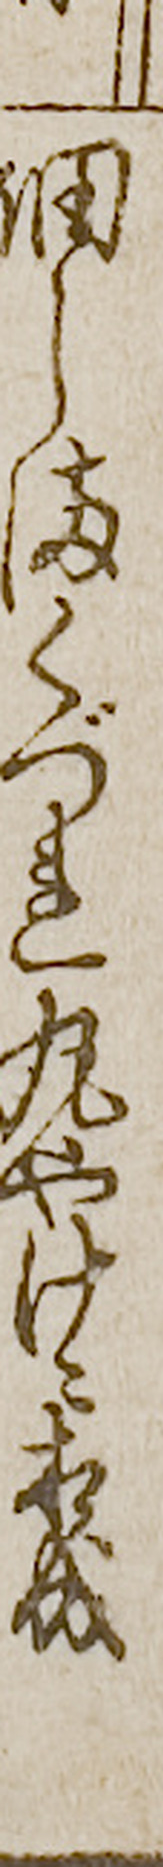佃しまくづれ丸やけに相成
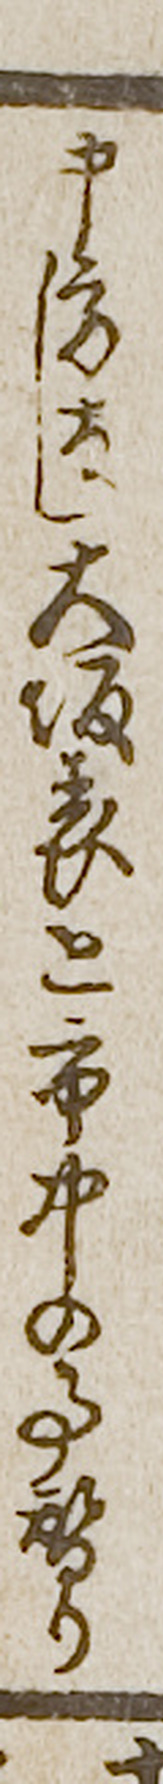申方なし大坂表と市中の事替り
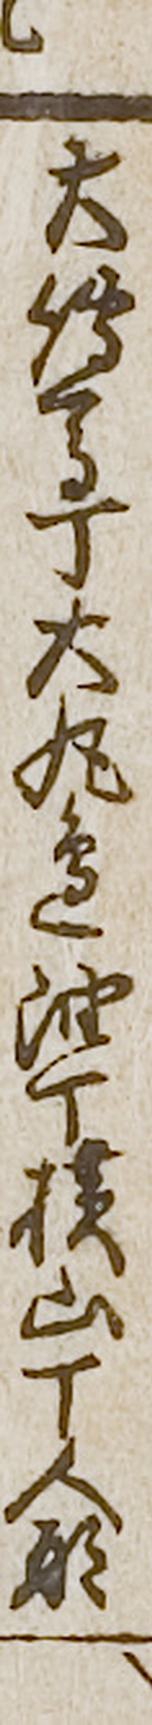大伝馬丁大丸辺油丁横山丁人形
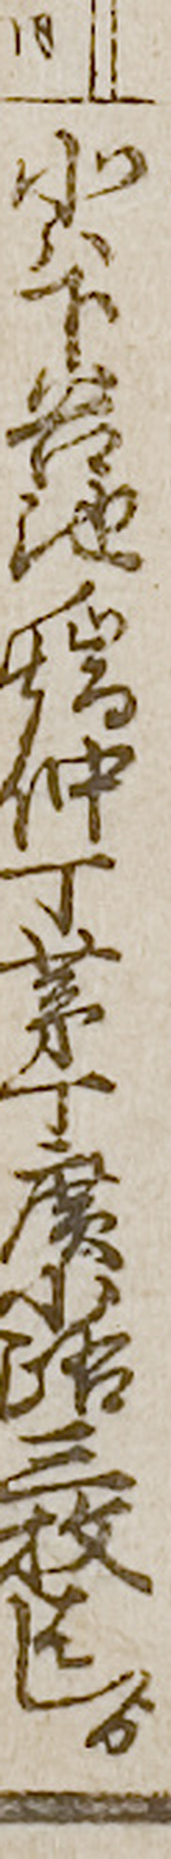北は下谷池の端仲丁茅丁広小路三枚はしゟ
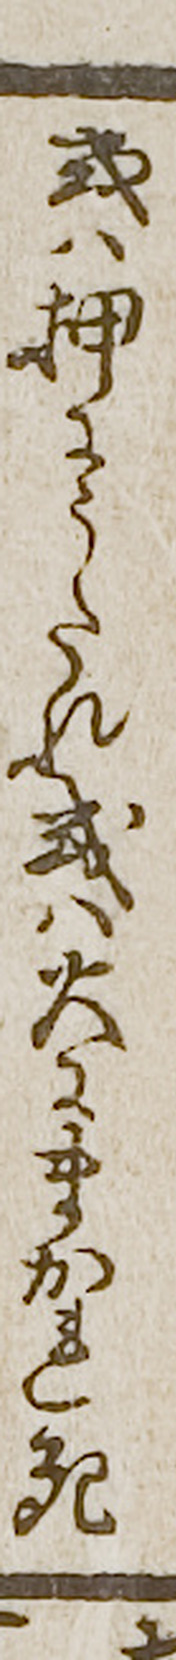或は押にうたれ或は火にまかれ死
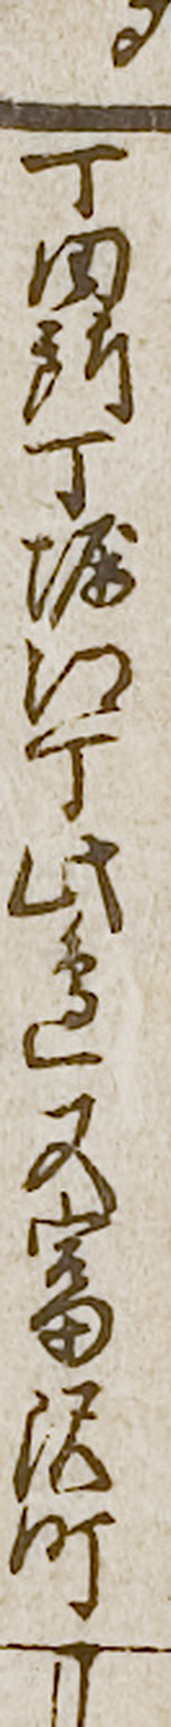丁田所丁堀江丁此辺又富沢町
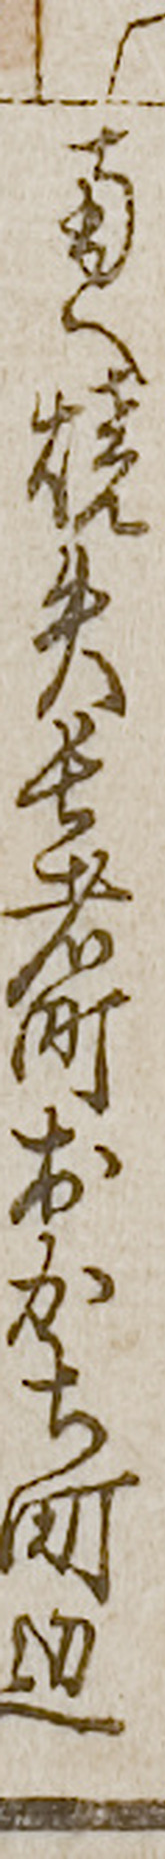南へ焼失長者町おかち町辺
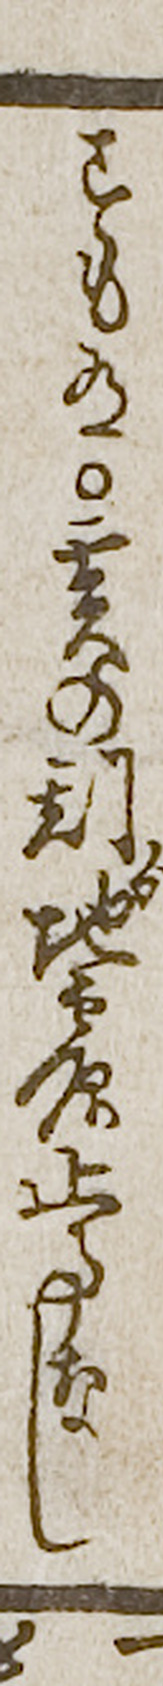すも有○亥の刻ゟ地震止事なし
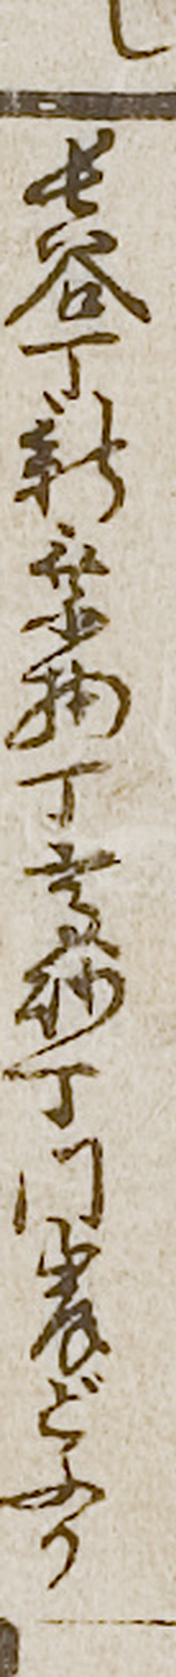長谷丁新乗物丁高砂丁川岸どふり
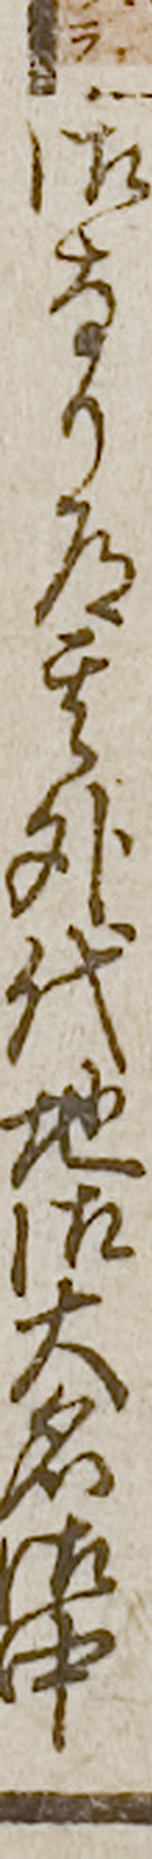御なり道其外代地御大名御中
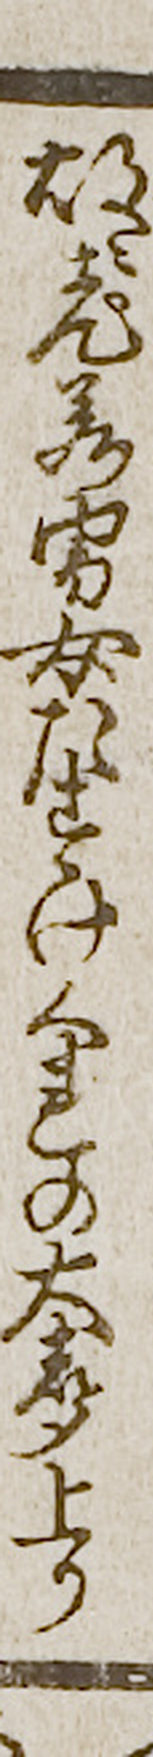故に老若男女たすけくれの大声上り
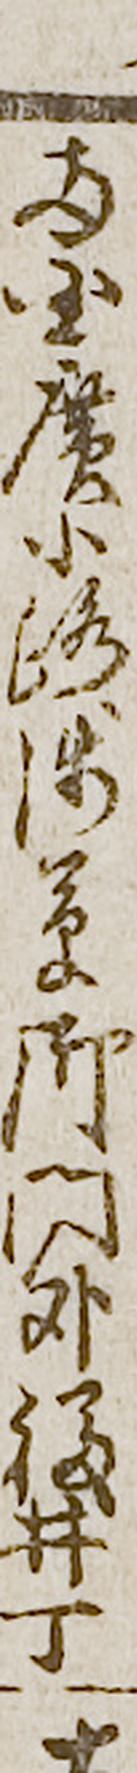両国広小路浅草御門外福井丁
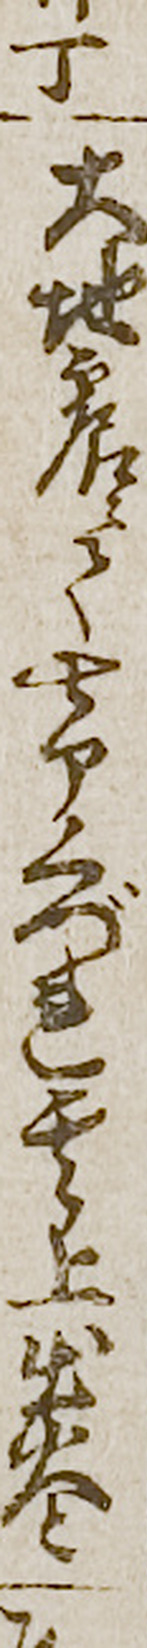大地震にて七部くづれ其上出火と
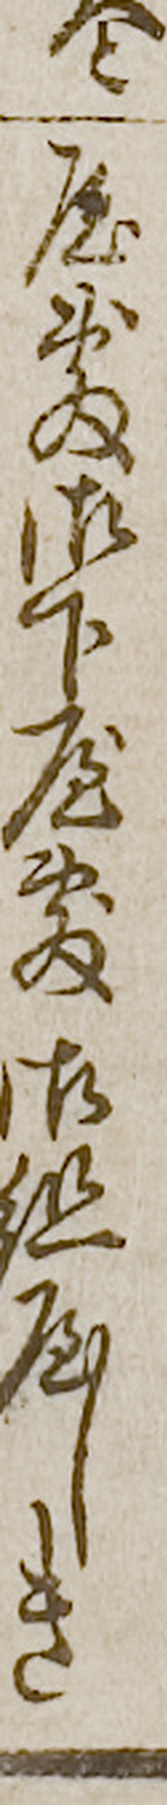屋敷御下屋敷御組屋しき
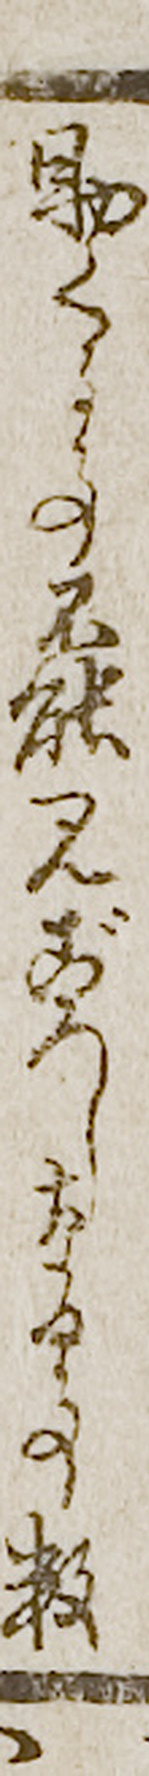助くる事不能見ごろしなる事数
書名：東都珍事実録咄
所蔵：東京大学総合図書館 General Library in the University of Tokyo, JAPAN
